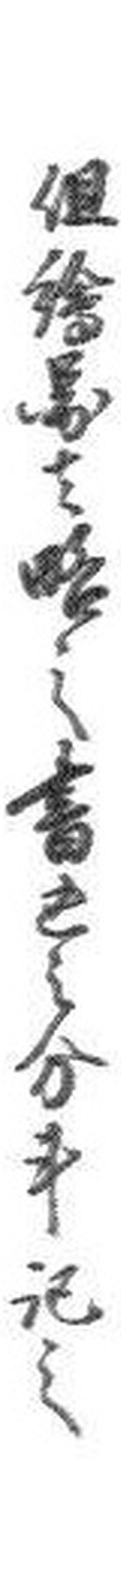但絵図者略之書込之分斗記之
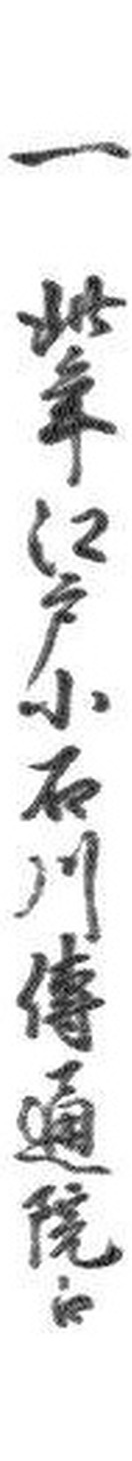一此年江戸小石川伝通院江
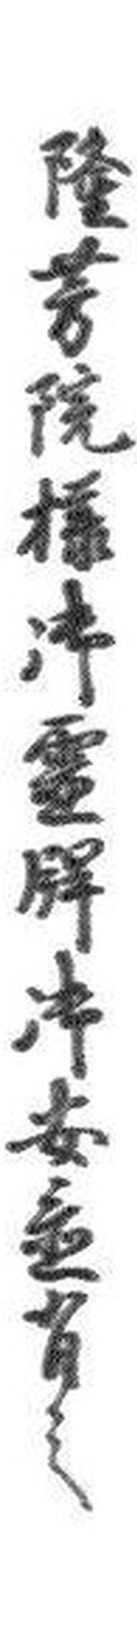隆芳院様御霊牌御安置有之
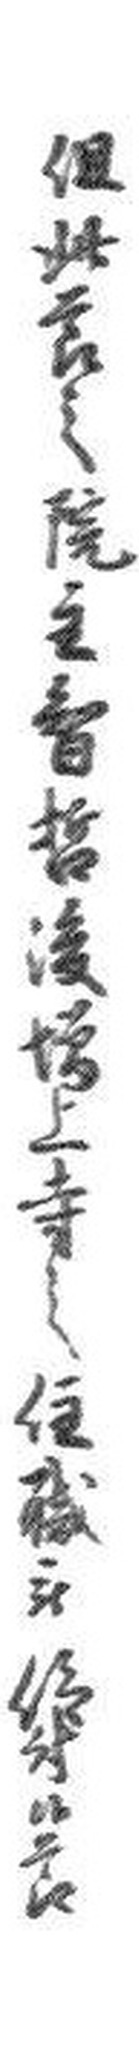但此節之院主智哲後増上寺之住職被仰付候節
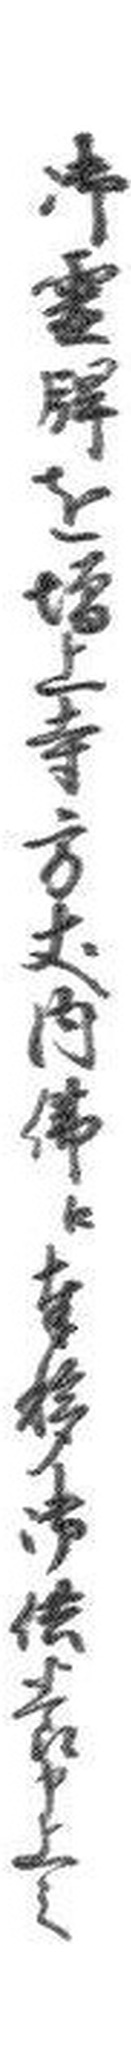御霊牌を増上寺方丈内仏江奉移御供養申上之

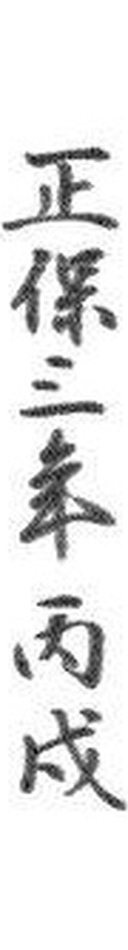正保三年丙戌
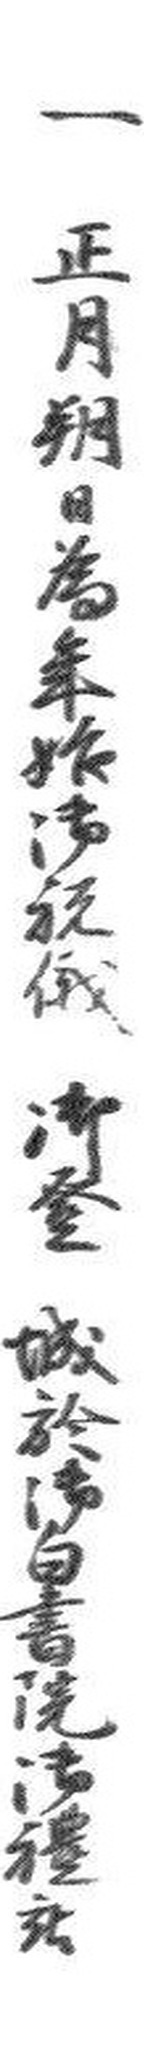一正月朔日為年始御祝儀御登城於御白書院御礼】被
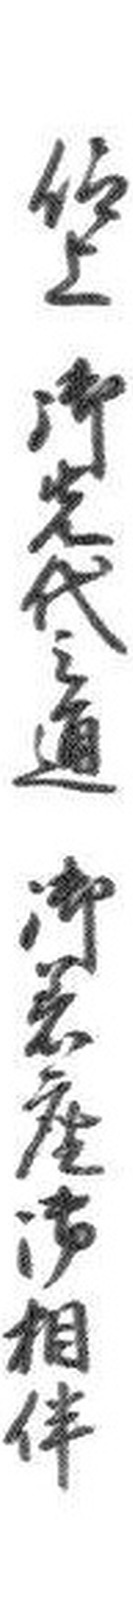仰上御先代之通御着座御相伴
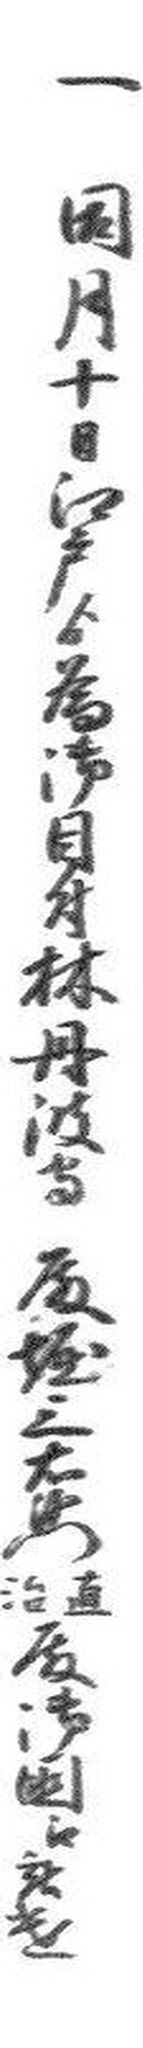一同月十日江戸ゟ為御目付林丹波守殿堀三右衛門直治殿御国江被遣
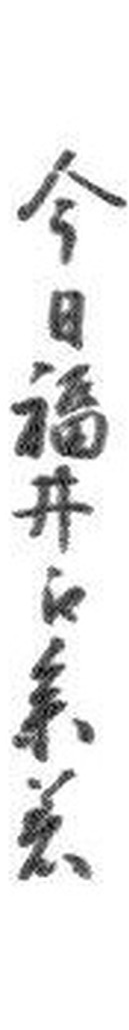今日福井江参着
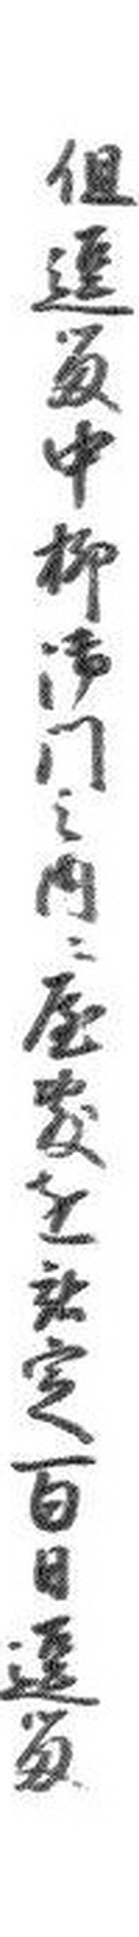但逗留中柳御門之内ニ屋敷を被定百日逗留
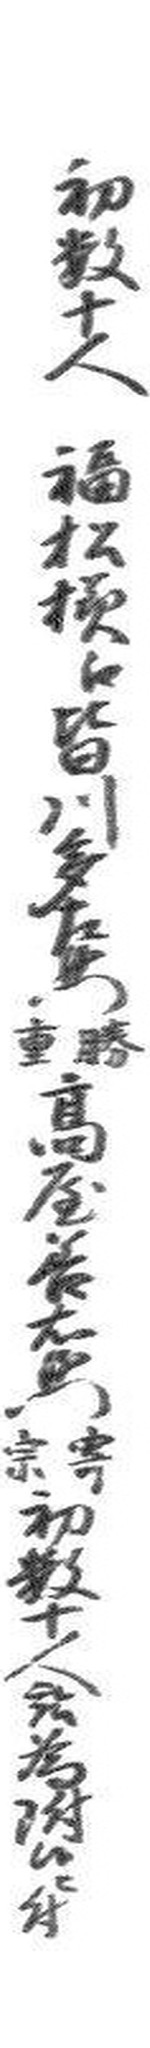初数十人福松様江皆川多左衛門勝重高屋善右衛門寄宗初数十人被為附候ニ付

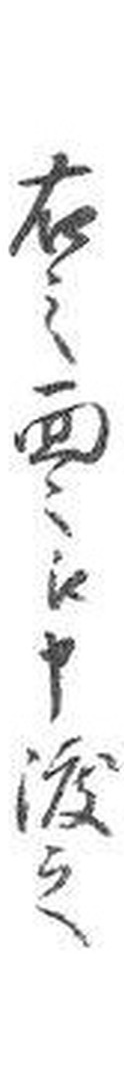右之面々江申渡之
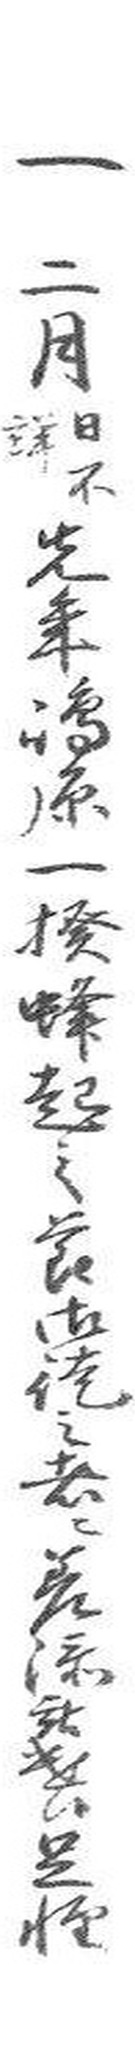一二月日不詳先年島原一揆蜂起之節御徒之者ニ差添被遣候足軽
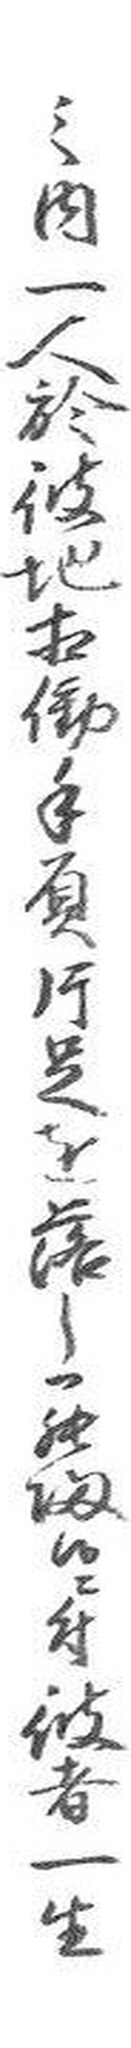之内一人於彼地相働手負片足を落し罷帰候ニ付彼者一生
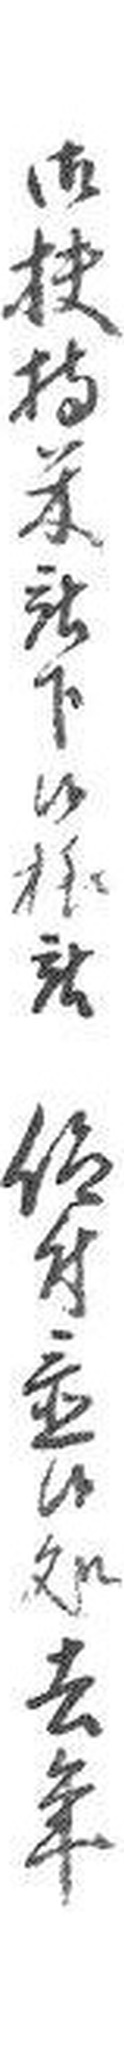御扶持米被下候様被仰付置候処去年
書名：家譜 五 光通公 従寛永十三年到万治二年
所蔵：福井県文書館 Fukui Prefectural Archives
